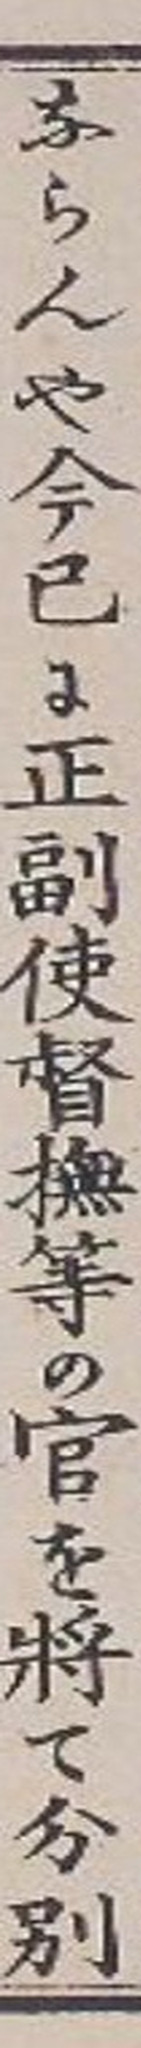ならんや今已に正副使督撫等の官を将て分別
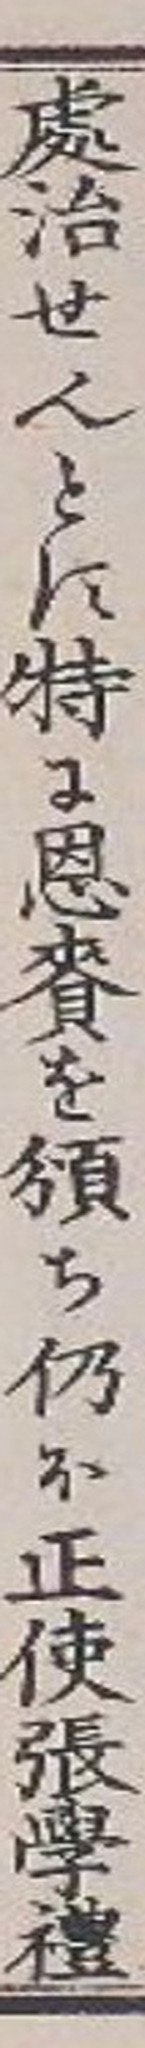処治せんとす特に恩賚を領ち仍ほ正使張学礼
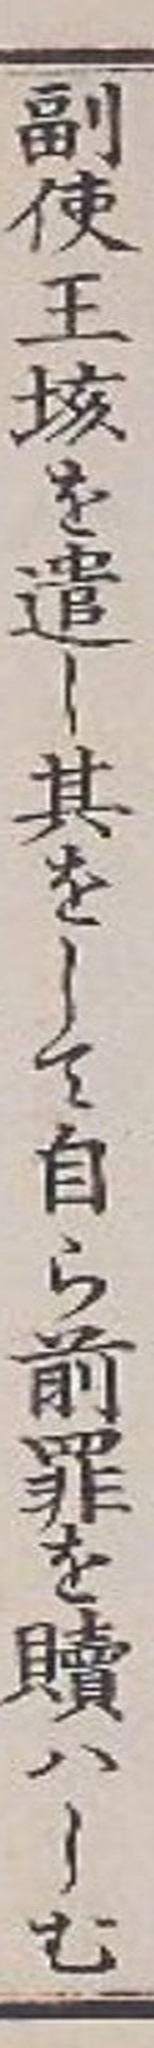副使王垓を遣し其をして自ら前罪を償はしむ
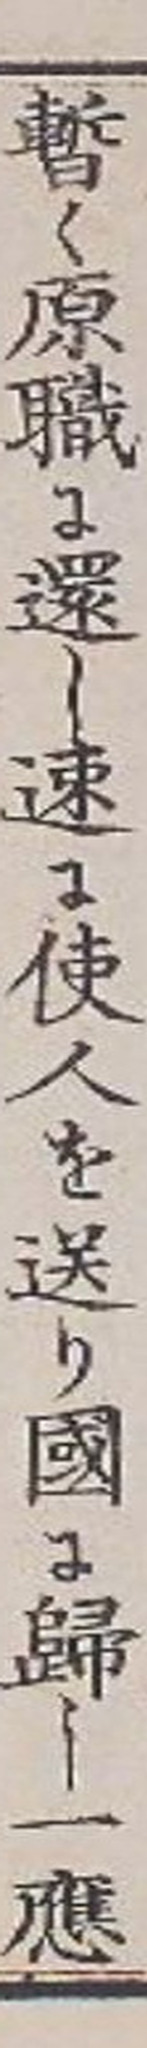暫く現職に還し速に使人を送り国に帰し一応
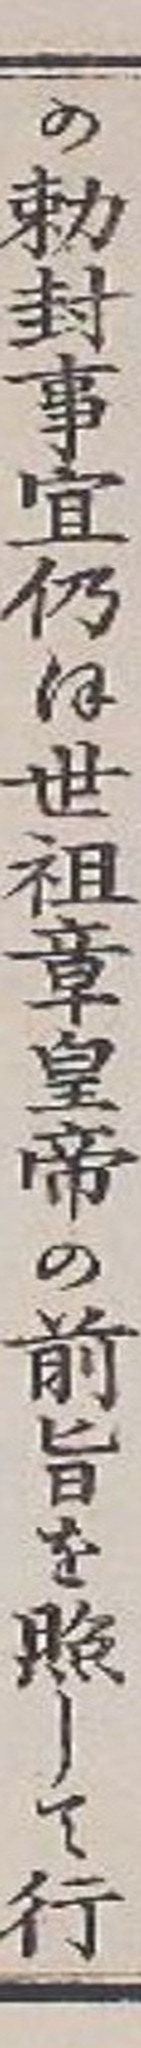の勅封事宣仍ほ世祖章皇帝の前旨を照して行
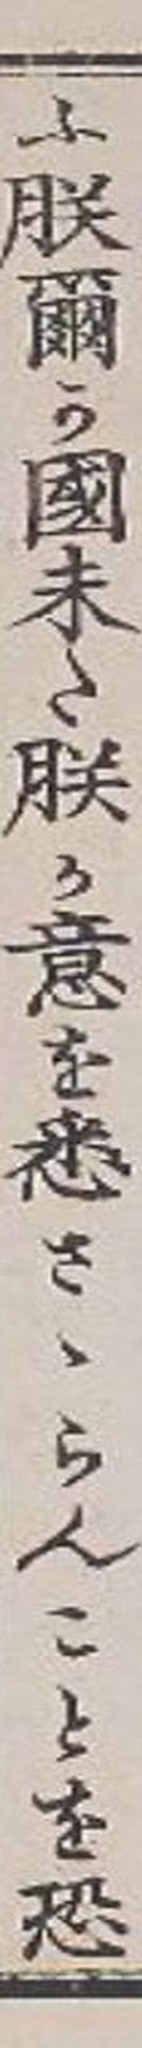ふ朕爾か国末た朕か意を悉さゝらんことを恐
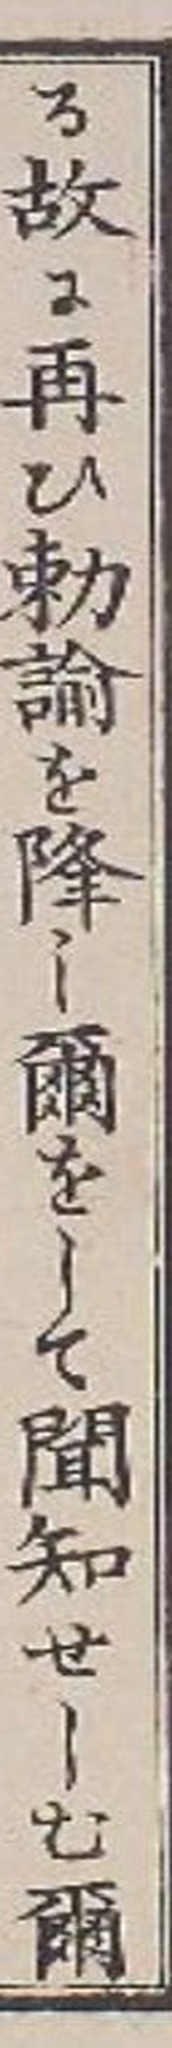る故に再ひ勅諭を降し爾をして聞知せしむ爾
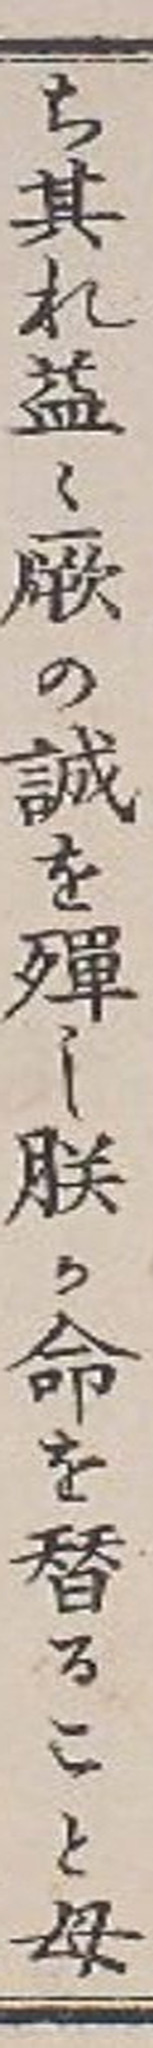ち其れ益々厥の誠を殫し朕か命を替ること母
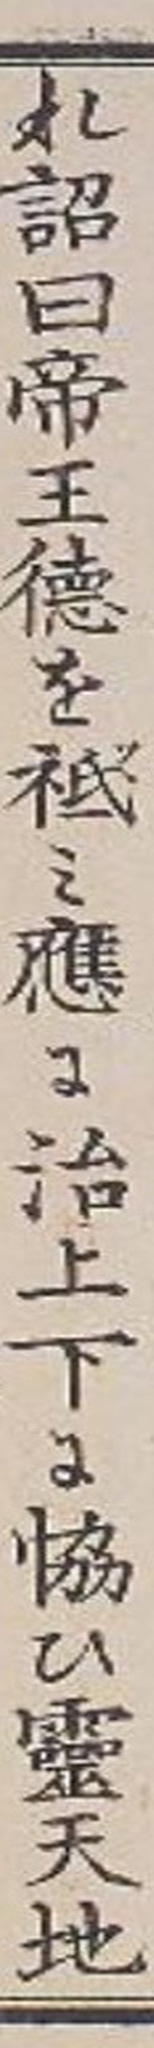れ詔曰帝王徳を袛み応に治上下に協ひ霊天地
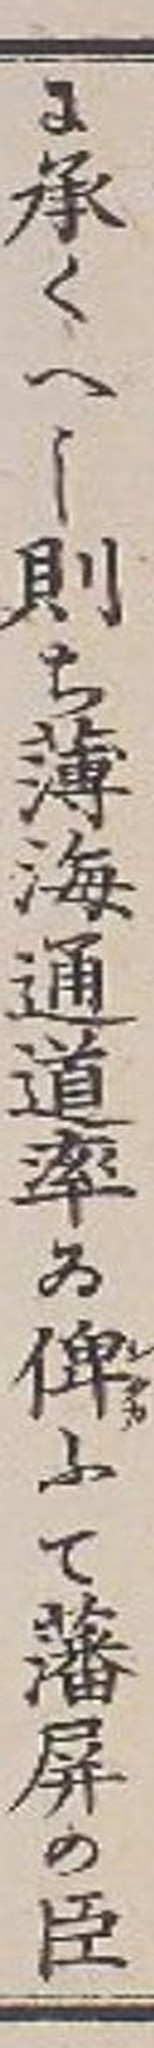に承くへし則ち薄海通道率ゐ俾ふて藩屏の臣
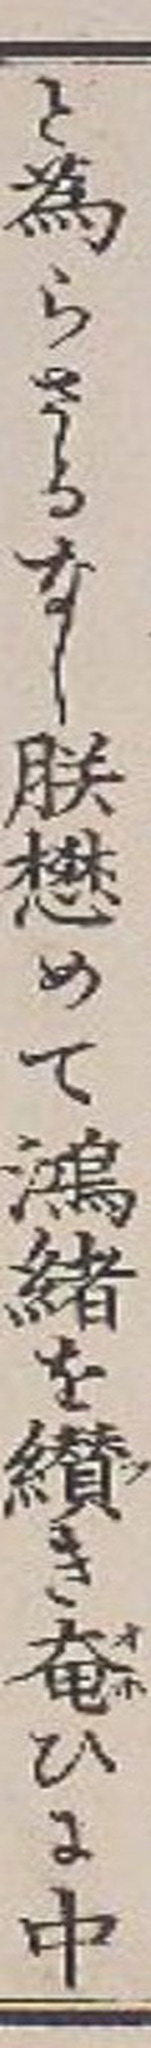と為らさるなし朕愗めて鴻緒を纉き奄ひに中
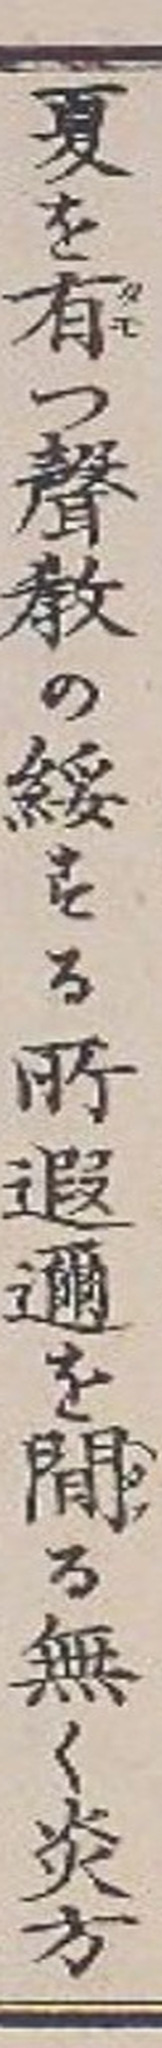夏を有つ声教の綏する所遐邇を間る無く炎方
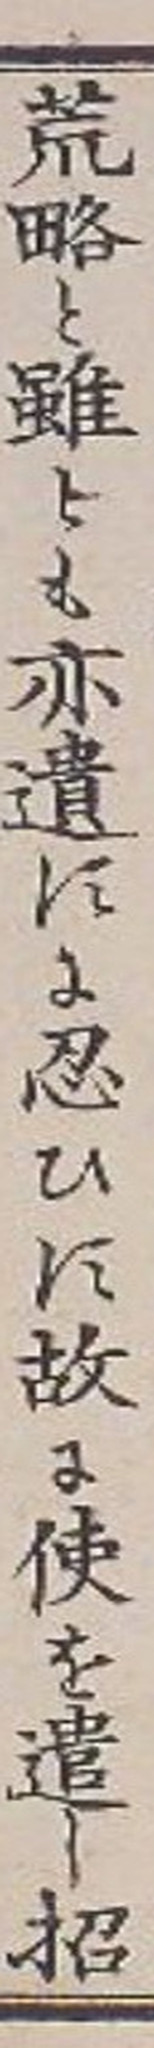荒略と雖とも亦遺すに忍ひす故に使を遣し招
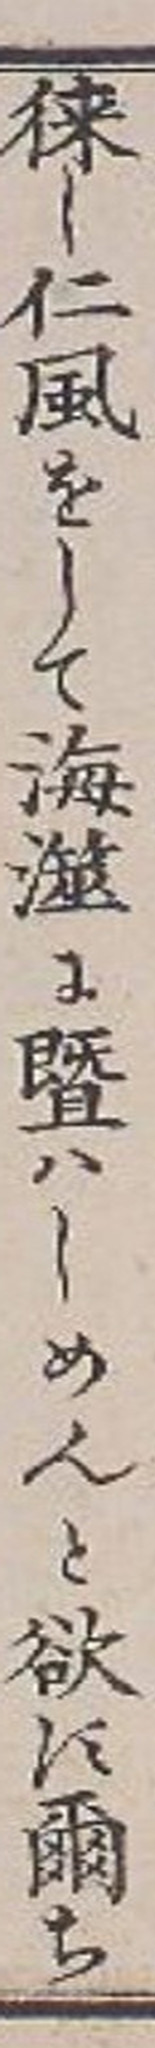来し仁風をして海澨に曁はしめんと欲す爾ち
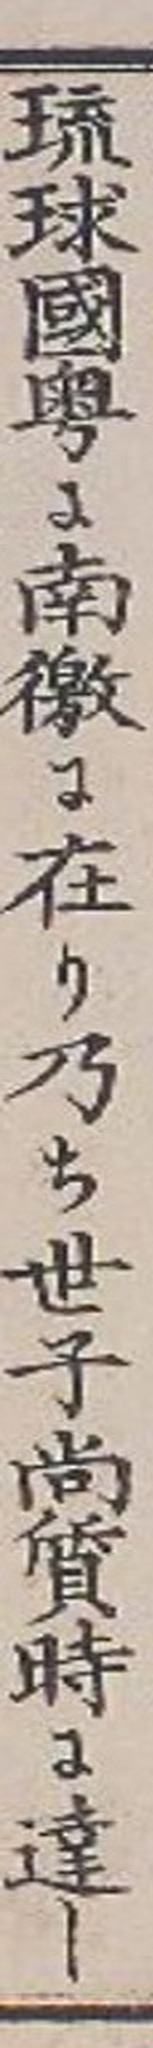琉球国号に南徼に在り乃ち世子尚質時に達し
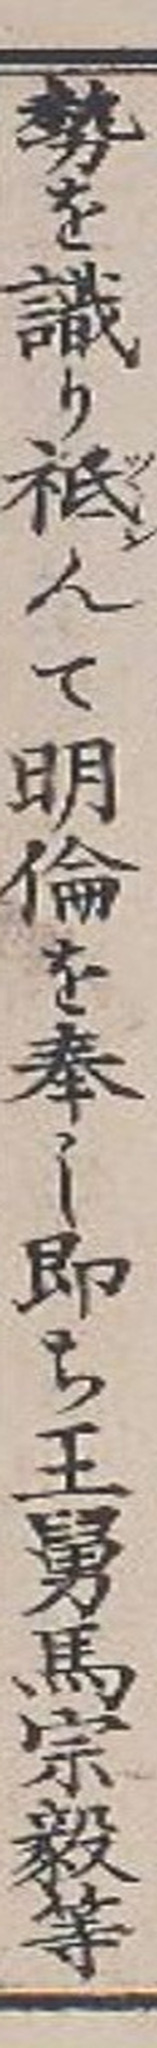勢を識り袛んて明倫を奉し則ち王舅馬宗毅等
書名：南島紀事 下
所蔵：University of the Ryukyus Library
